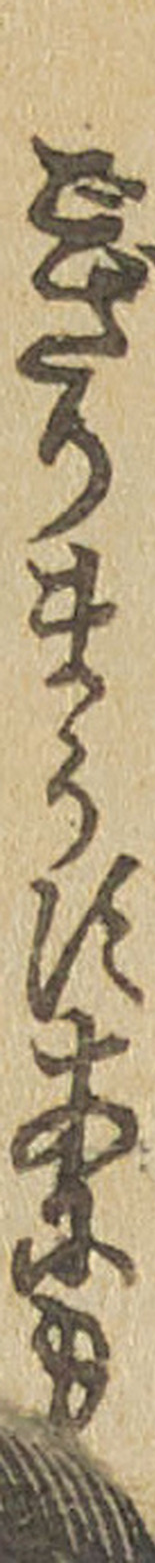ござりまうすあにも
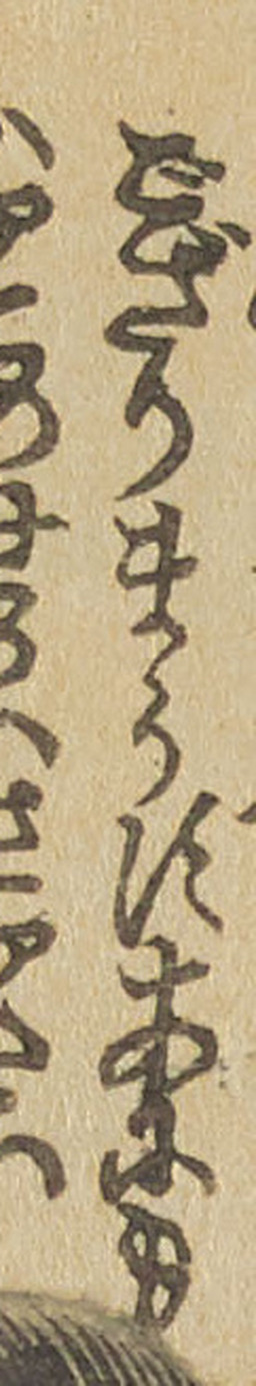ハァこのせかいさァたい
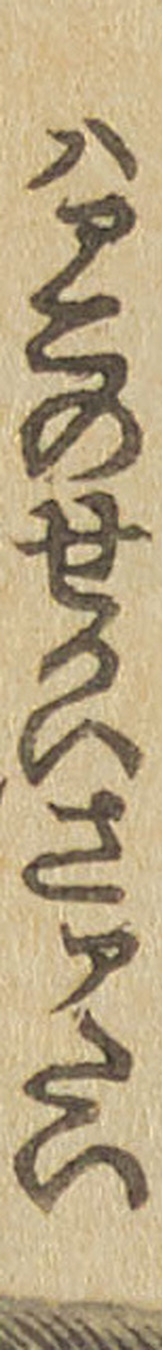ハァこのせかいさァたい
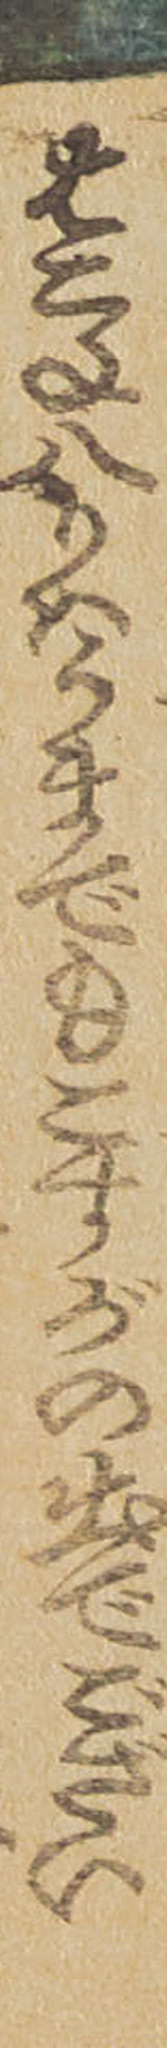はこね八りはうまでもこすがの出でござい
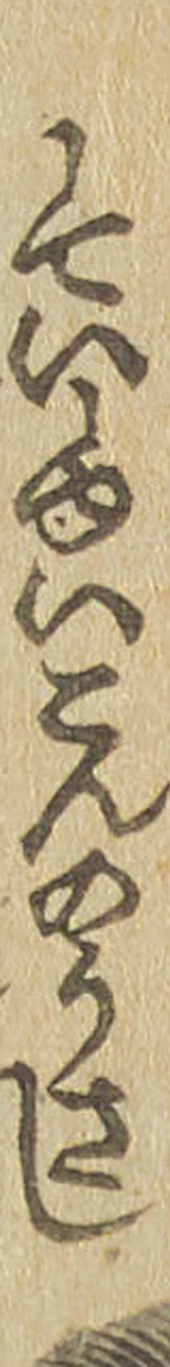していしゆいこんのうさし
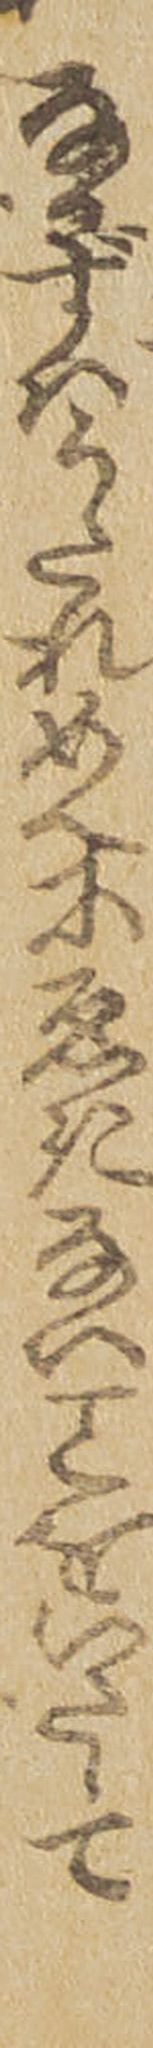なかずはうたれめへにゑきないことをいたして
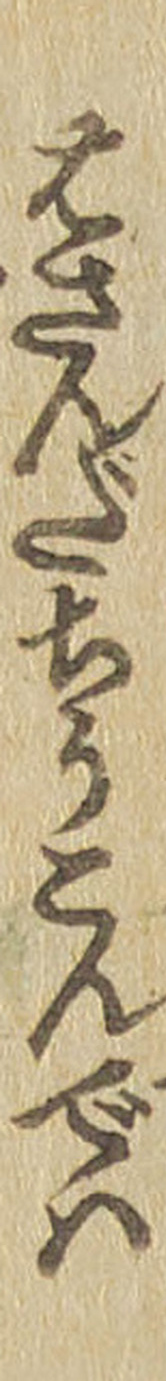はさんだちうこんでは
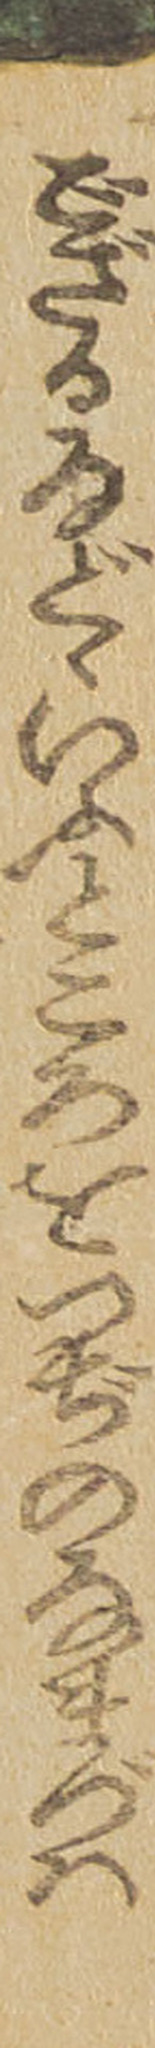ござるなどゝいふところをつぢのなまづは
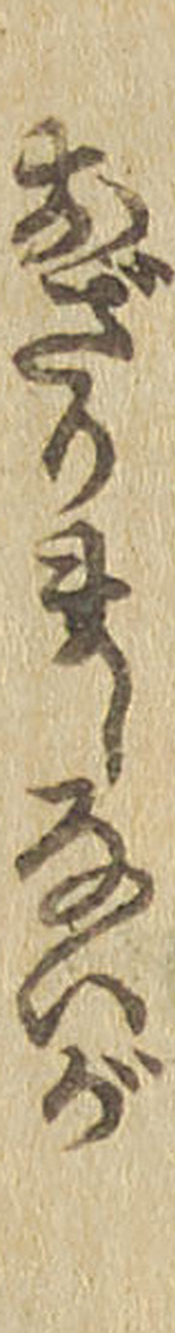おざりましないが
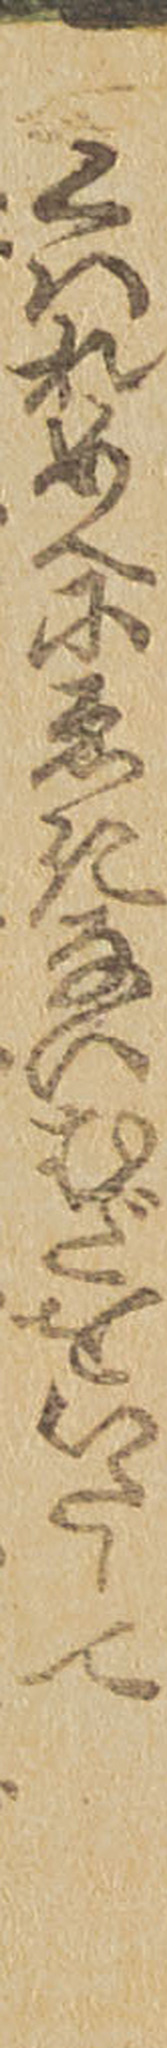くはれめへにゑきないむだをいたして
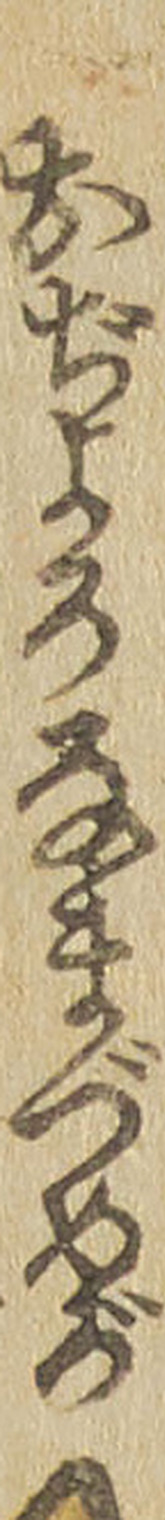おぢよろなまづめが
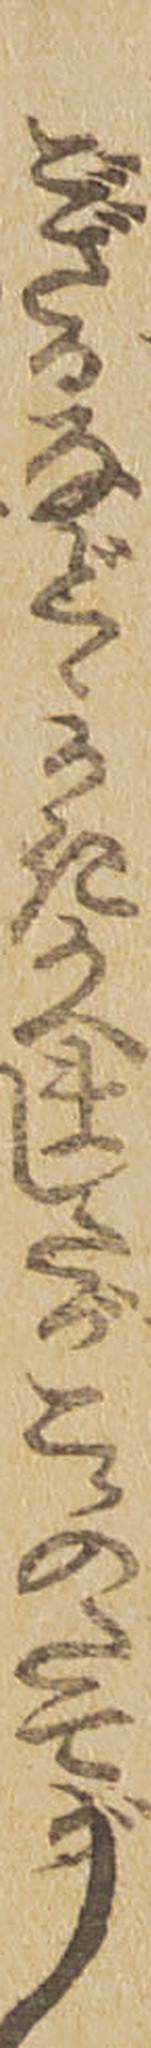ござるなどゝかきかへましたがこゝのたてが
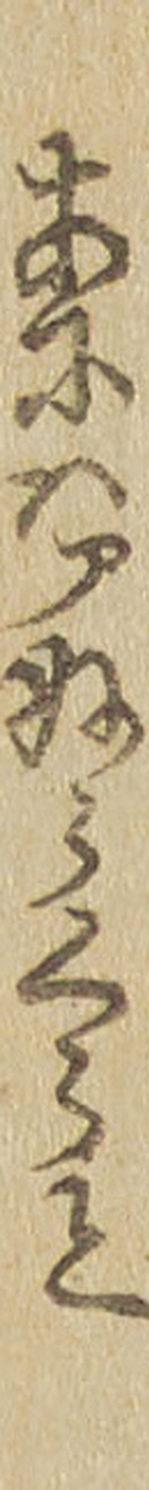あにハァねらくらと
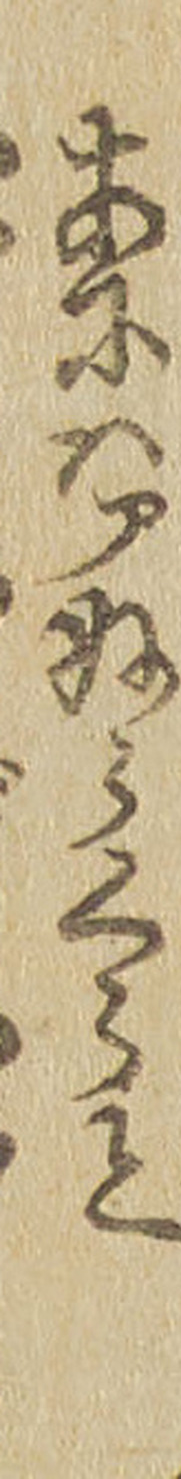あにハァねらくらと
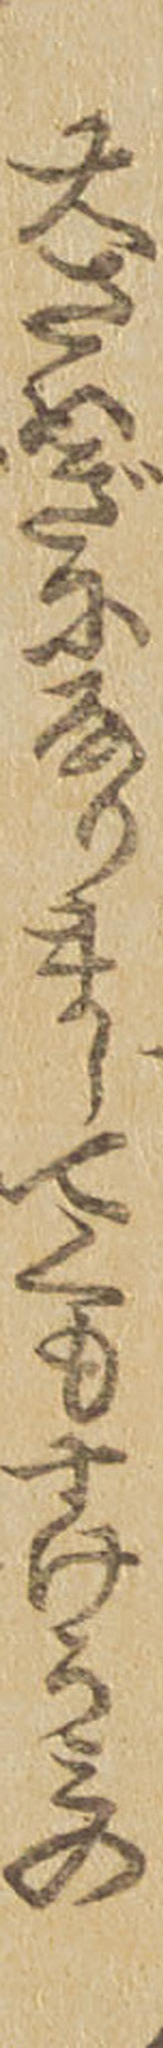大さはぎになりましてくもすけうみの
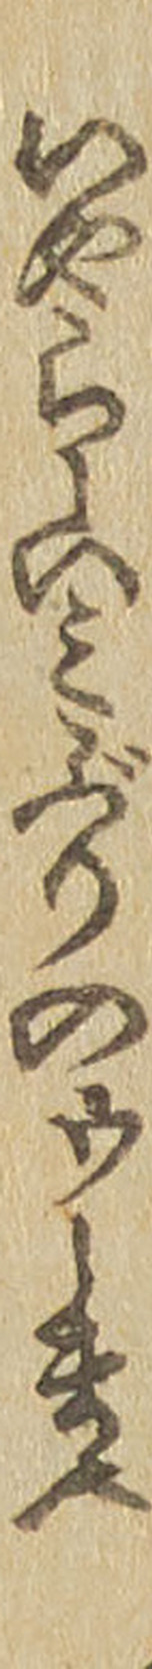いやらしいみぶりのゥしまへ
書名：地震太平記
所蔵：東京大学総合図書館 General Library in the University of Tokyo, JAPAN
